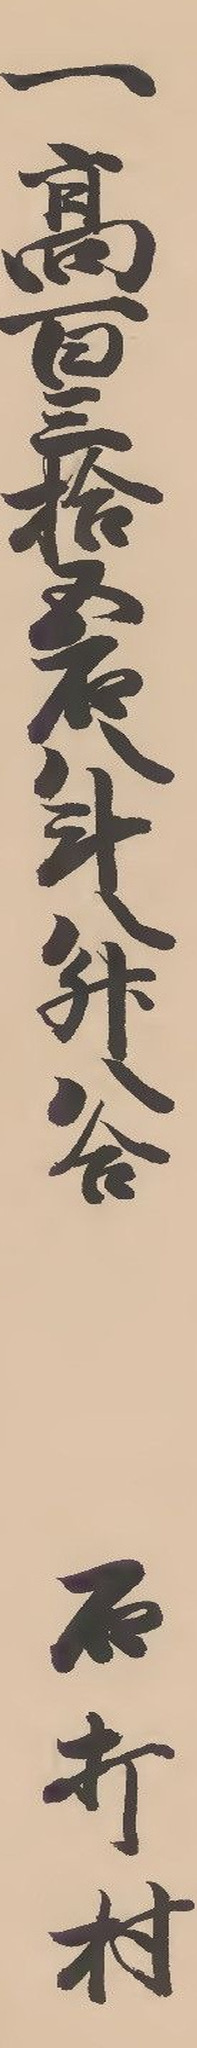一高百三拾五石八斗八升八合石打村

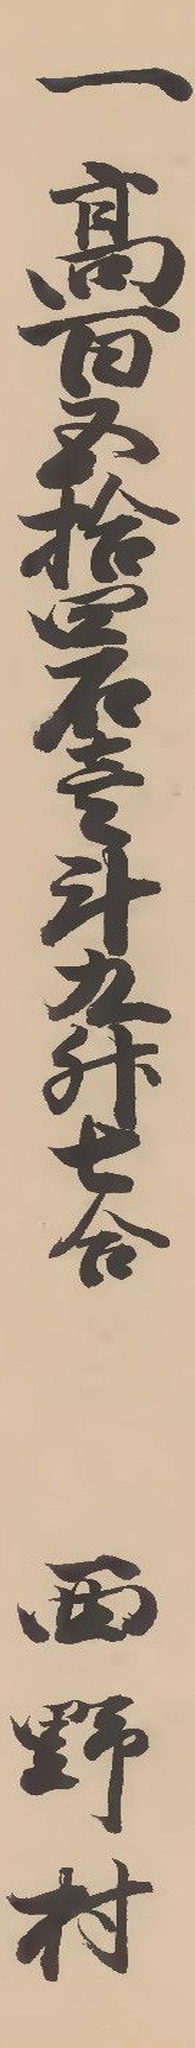一高百五拾四石壱斗九升七合西野村
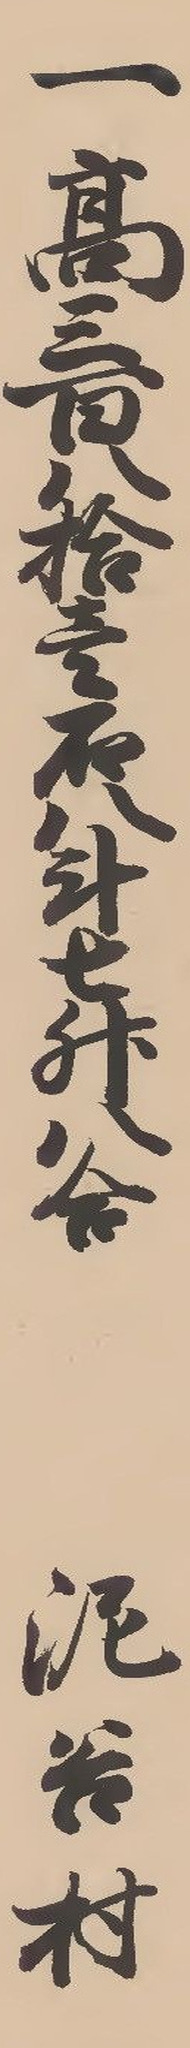一高三百八拾壱石八斗七升八合泥谷村
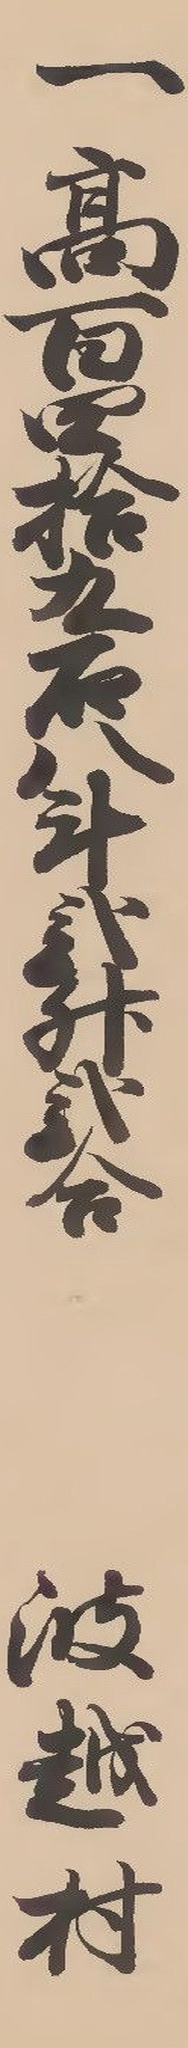一高百四拾九石八斗弐升弐合波越村
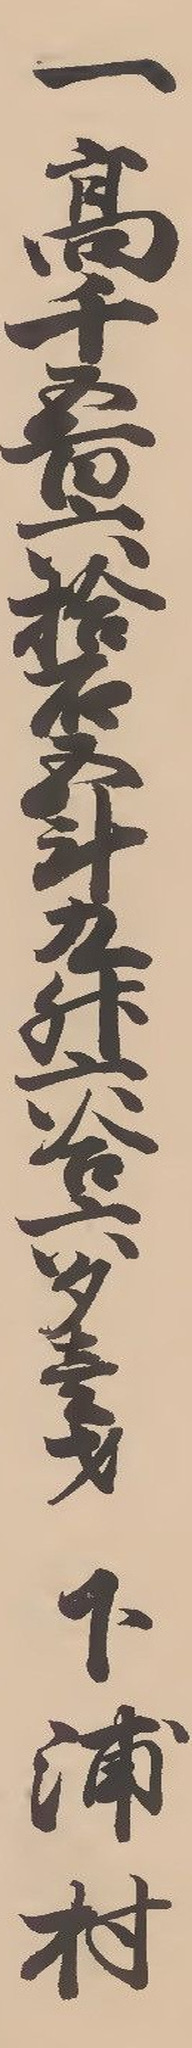一高千五百六拾石五斗九升六合六勺壱才下浦村
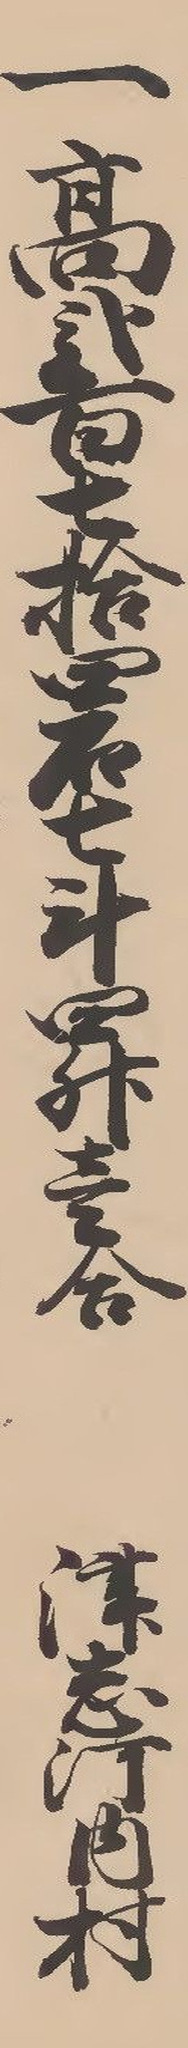一高弐百七拾四石七斗四升壱合津志河内村
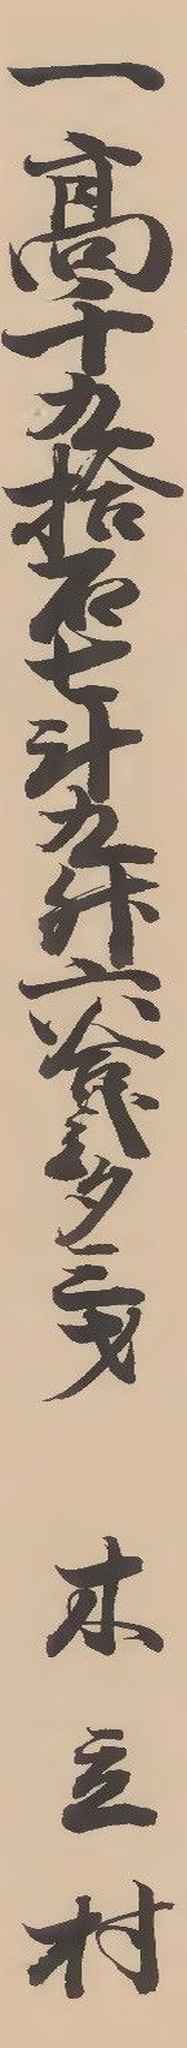一高千九拾石七斗九升六合弐勺三才木立村
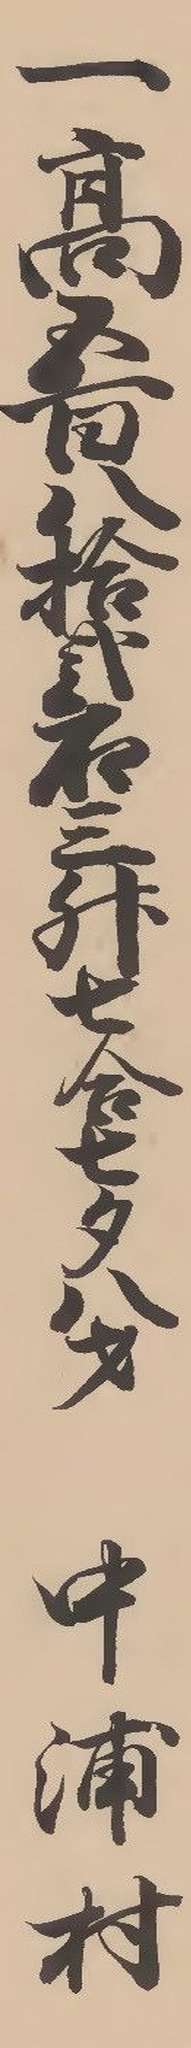一高五百八拾弐石三升七合七勺八才中浦村
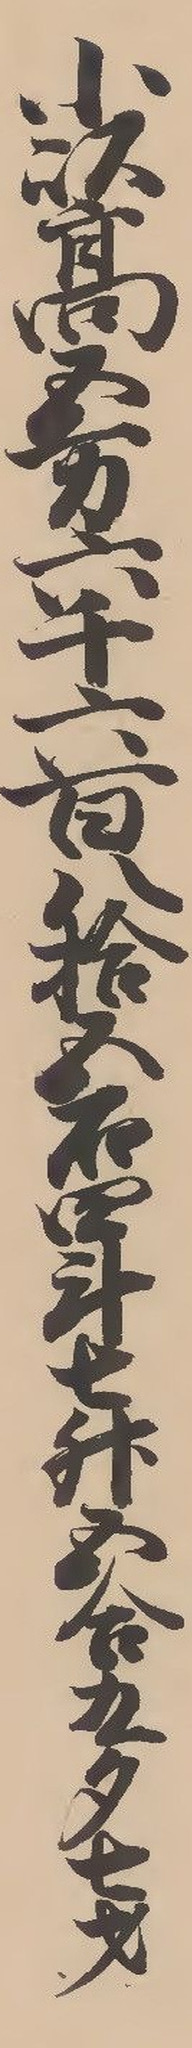小以高五万六千六百八拾五石四斗七升五合九勺七才

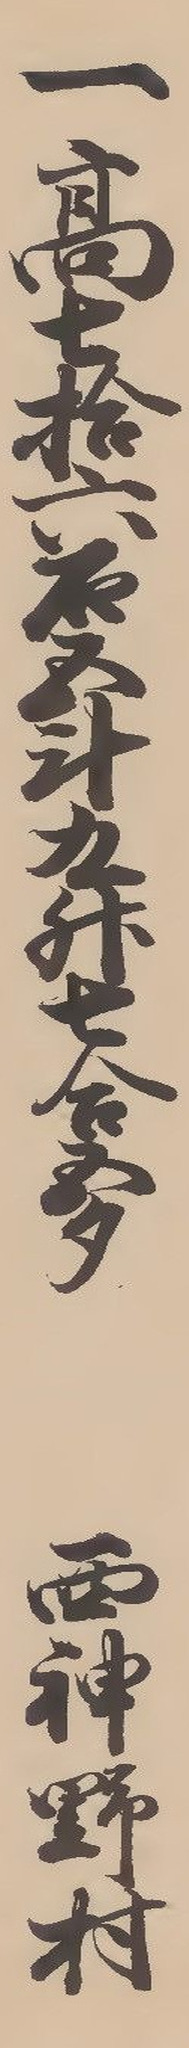一高七拾六石五斗九升七合五勺西神野村
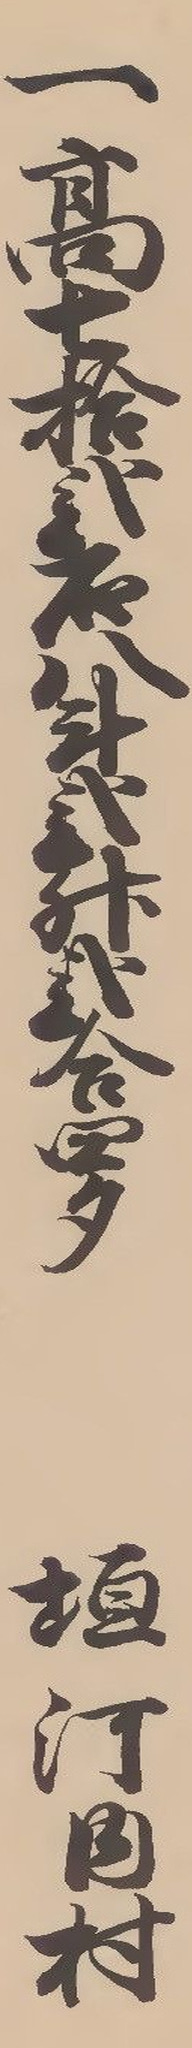一高七拾弐石八斗弐升弐合四勺垣河内村
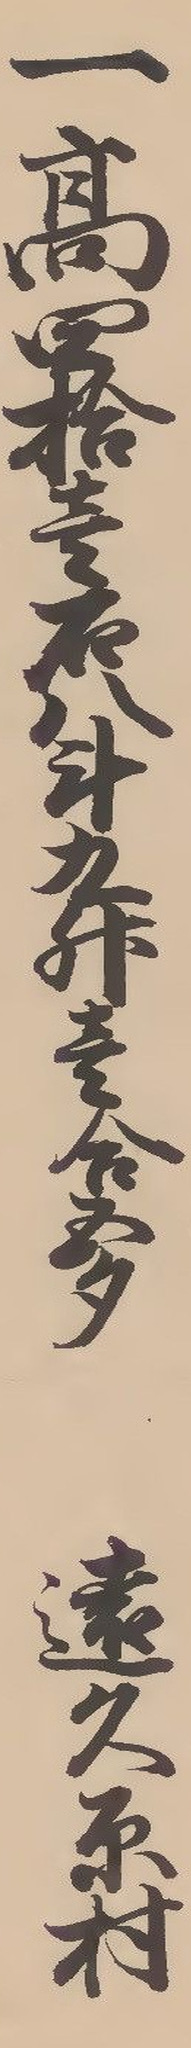一高四拾壱石八斗九升壱合五勺遠久原村

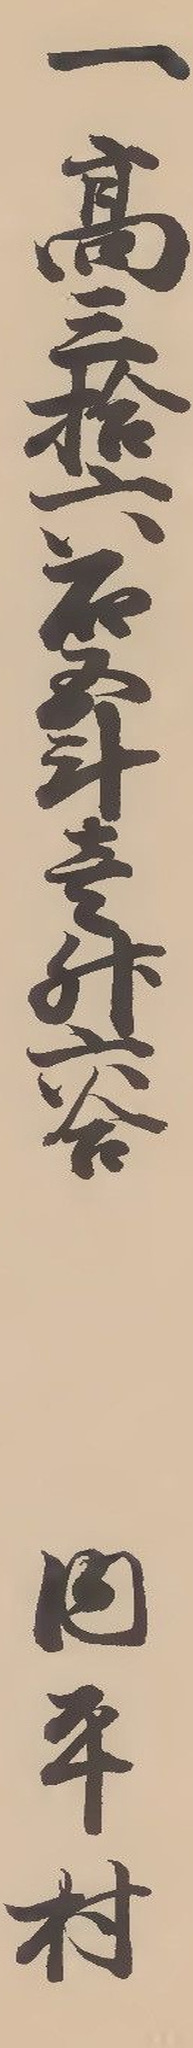一高三拾六石五斗壱升六合内平村
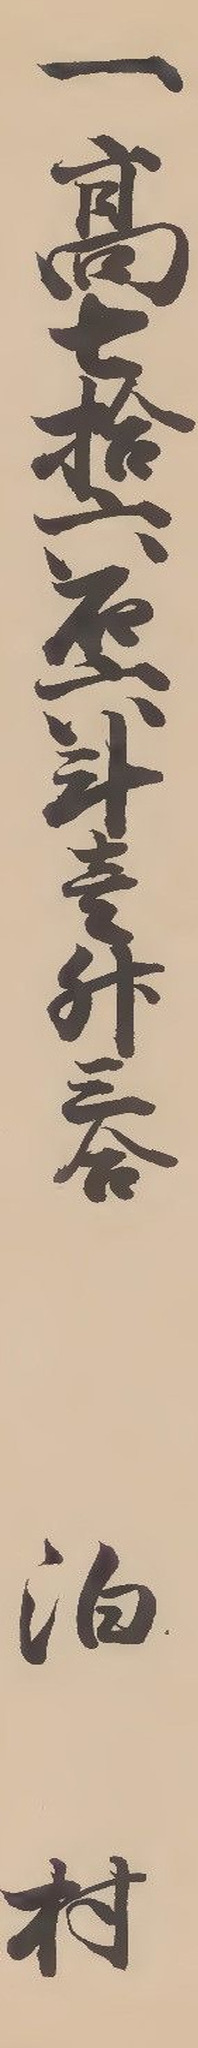一高七拾六石六斗壱升三合泊村
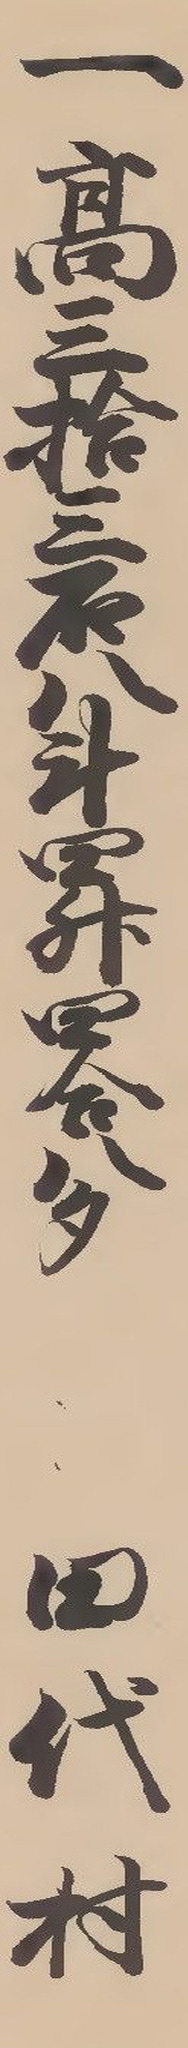一高三拾三石八斗四升四合八勺田代村
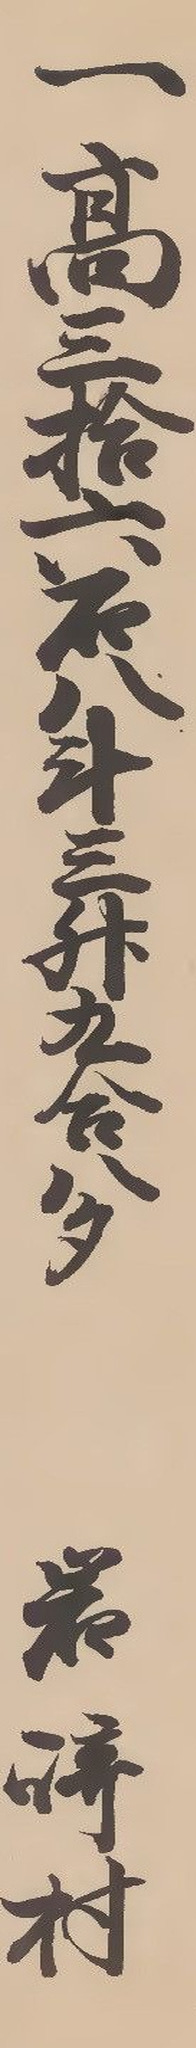一高三拾六石八斗三升九合八勺岩崎村
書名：豊後国郷帳
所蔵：国立公文書館 National Archives of Japan
